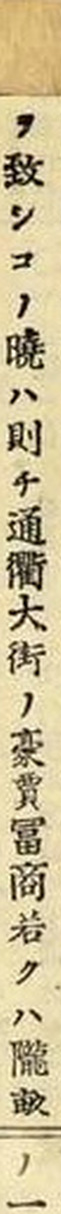ヲ致シコノ曉ハ則チ通衢大街ノ豪賈冨商若クハ隴畝
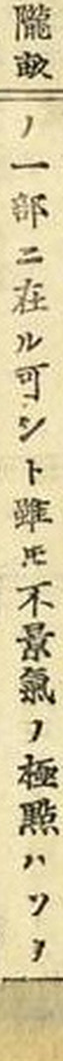ノ一部ニ在ル可シト雖𪜈不景氣ノ極點ハソノ
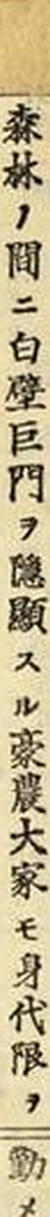森林ノ間ニ白壁巨門ヲ隠顯スル豪農大家モ身代限ヲ
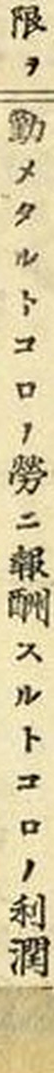勤メタルトコロノ勞ニ報酬スルトコロノ利潤
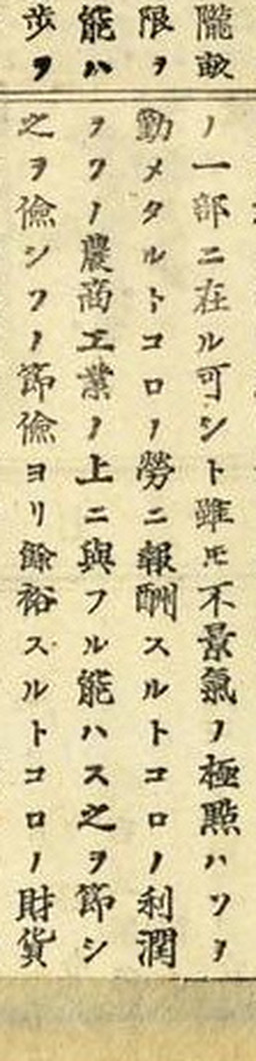ヲソノ農商工業ノ上ニ與フル能ハス之ヲ節シ
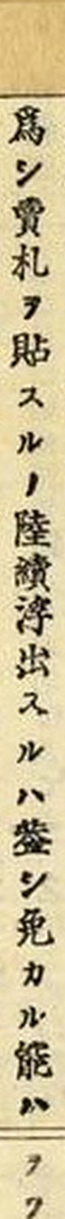爲シ賣札ヲ貼スルノ陸續淳出スルハ葢シ免カル能ハ
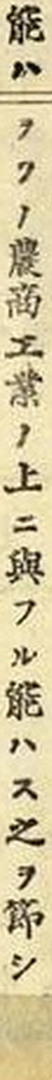ヲソノ農商工業ノ上ニ與フル能ハス之ヲ節シ
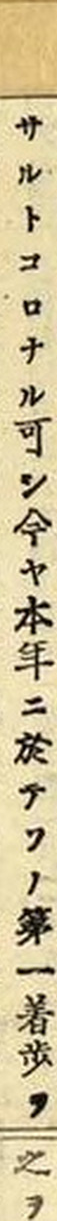サルトコロナル可シ今ヤ本年ニ於テソノ第一着歩ヲ
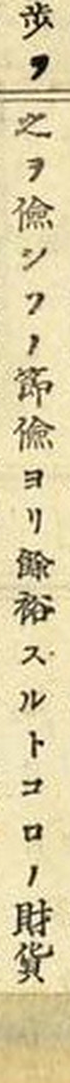之ヲ儉シソノ節儉ヨリ餘裕スルトコロノ財貨
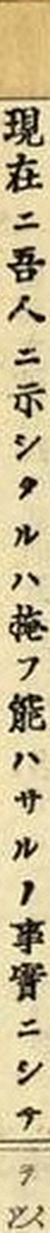現在ニ吾人ニ示シタルハ掩フ能ハサルノ事實ニシテ
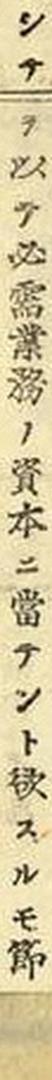ヲ以テ必需業務ノ資本ニ當テント欲スルモ節
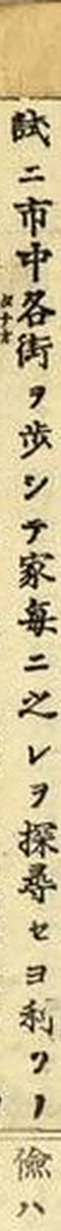試ニ市中各街ヲ歩シテ家毎ニ之レヲ探尋セヨ利ソノ
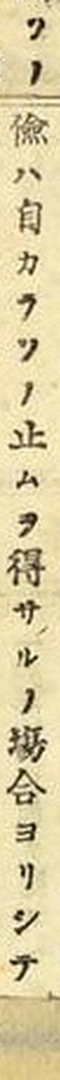儉ハ自カラソノ止ムヲ得サルノ塲合ヨリシテ
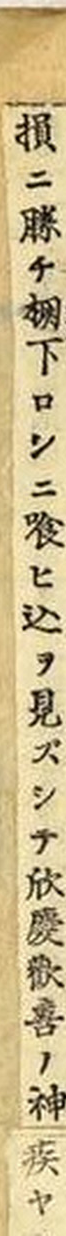損ニ勝チ棚下ロシ喰ヒ込ヲ見ズシテ欣慶歡喜ノ神
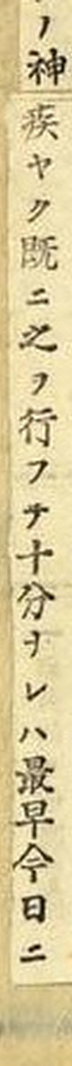疾ヤク既ニ之ヲ行フテ十分ナレハ最早今日ニ

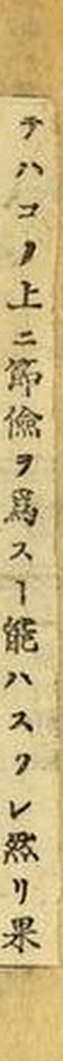テハコノ上ニ節儉ヲ爲スヿ能ハスソレ然リ果
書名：温古集 五巻
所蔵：福井県文書館 Fukui Prefectural Archives
